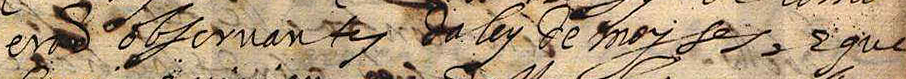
eraõ obseruantes da ley de moyses, E que
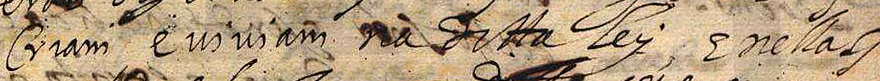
Criam, e uiuiam na ditta Ley, E nella Es
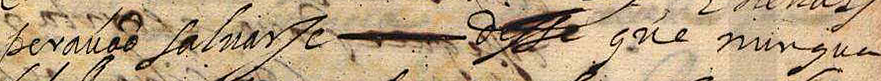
perauão saluarse - disse que nunqua
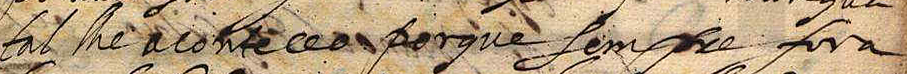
tal lhe aconteceo porque sempre fora
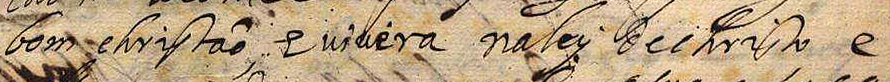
bom christaõ, E uiuera na ley de christo e
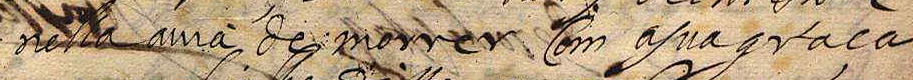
nella auia de morrer Com a sua graça
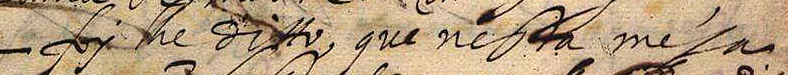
- foy lhe ditto, que nesta mesa
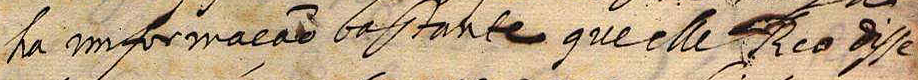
ha imformação bastante que elle Reo disse
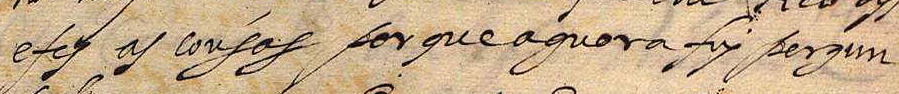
e fes as cousas porque aguora foy pergun
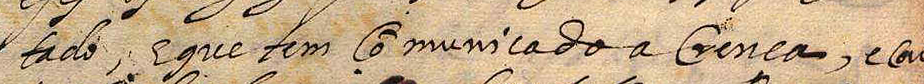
tado, E que tem Cōmunicado a Crença, e cou
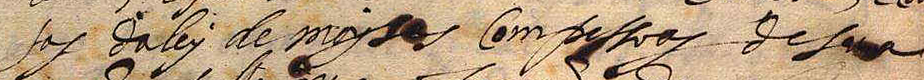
sas da ley de moyses Com pessoas de sua
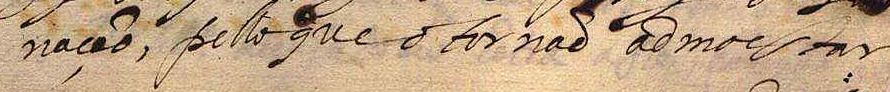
naçaõ, pello que o tornaõ admoestar
